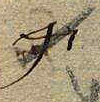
41
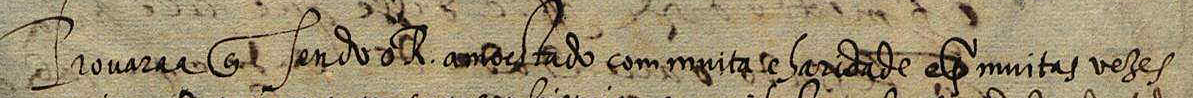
̄Prouaraa q̄ sendo o R. amoestado com muita charidade e p̄o muitas vezes
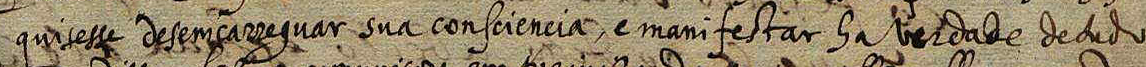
quisesse desemcarreguar sua consciencia, e manifestar ha verdade de tudo
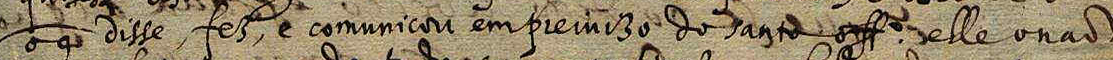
o q̄ disse, fez, e comunicou em preiuizo do santo offo. elle o naõ
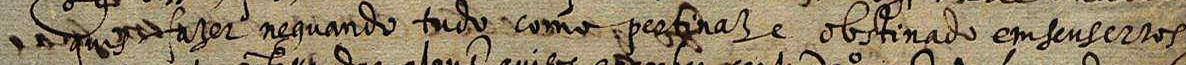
quis fazer neguando tudo como pertinaz e obstinado em seus erros
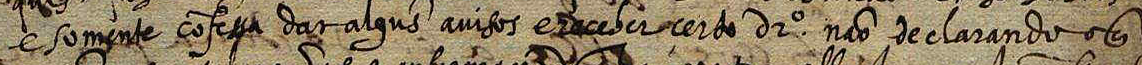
e somente cōfessa dar algus̄ auisos e receber certo dro. naõ declarando o q̄
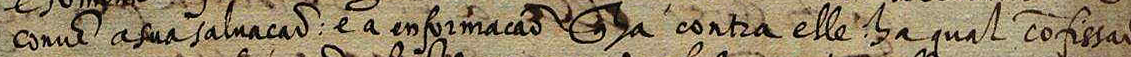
conuē a sua saluaçaõ: e a enformaçaõ q̄ ha contra elle ha qual cōfissaõ
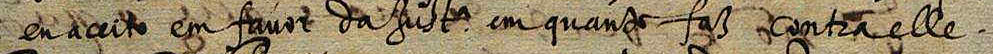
eu aceito em fauor da Justa. emquanto faz contra elle.
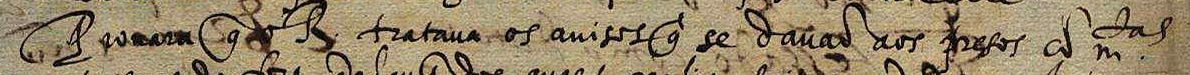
Prouara q̄ o R. trataua os auisos q̄ se dauaõ aos presos cō m.tas
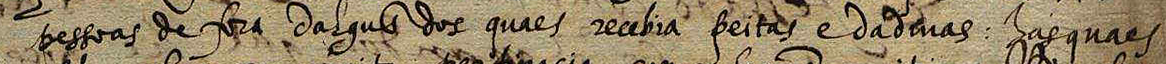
pessoas de fora dalgus̄ dos quaes recebia peitas e dadiuas: has quaes
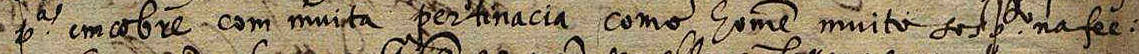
pas. emcobre com muita pertinacia como hom̄e muito sosp.to na fee
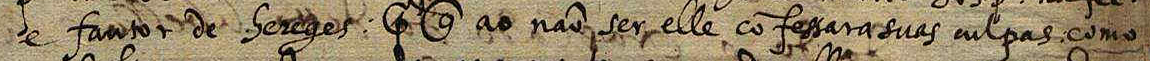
e fautor de hereges: p̄oq̄ ao naõ ser elle cōfessara suas culpas como
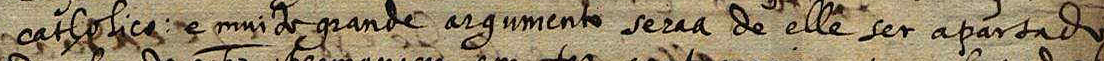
catholico: e muito grande argumento seraa de elle ser apartado
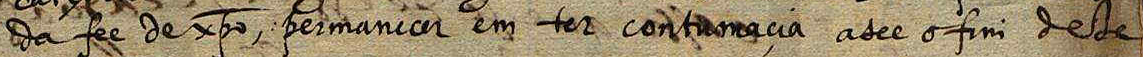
da fee de xp̅o, permanecer em ter contumacia atee o fim deste
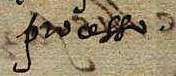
processo.
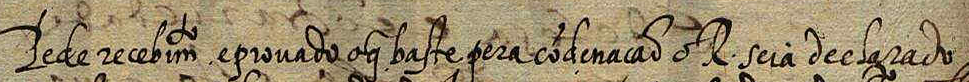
Pede recebimto e prouado o q̄ baste pera cōdenação o R. seia declarado
